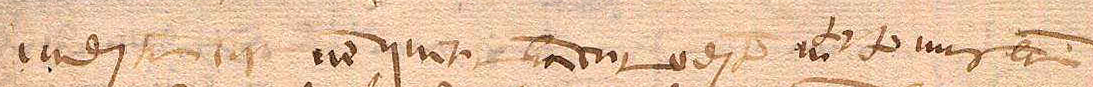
na djta casa nō querer lāçar o djto mter tomas lā
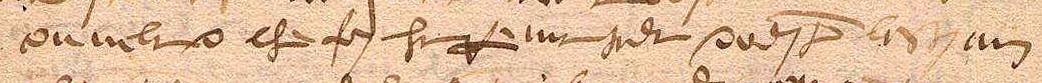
çou nela e lhe foy haRematada e o djto bastjam
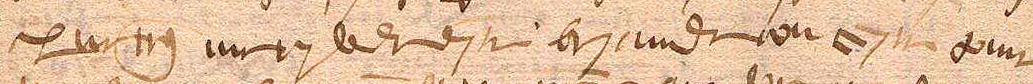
aLuarr̄z marjdo da djta brjanda coucejra toma
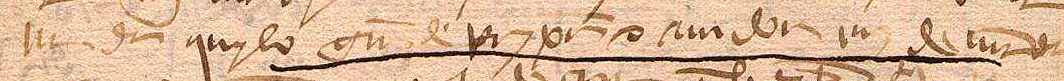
rra daquylo grāde pajxā e amdou em demāda
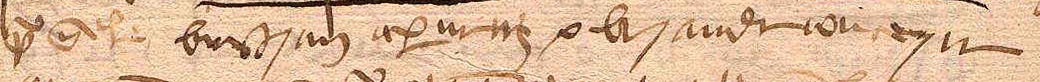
p̄oq̄ ele bastjam aLuarrz e brjanda coucejra
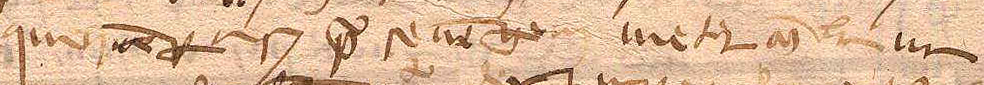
queriā ꝑa sj p̄o se nēgem meter cō ela na
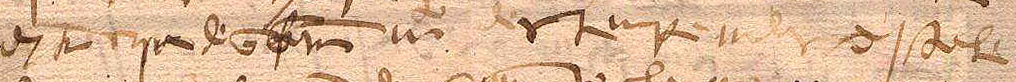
djta casa de q̄ forā mto destemperados e Jsto he
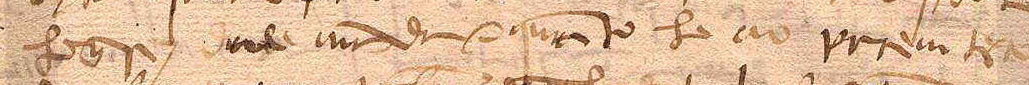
ho q̄ sej da demāda e quāto he ao paremtesco
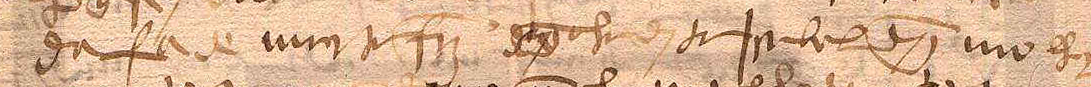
da fa de marta frz̄ djgo ha djta Jsabel dj̄z molher
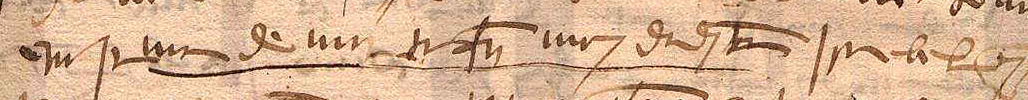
era Jrma de marta frz̄ maj da dita Jsabel djz̄
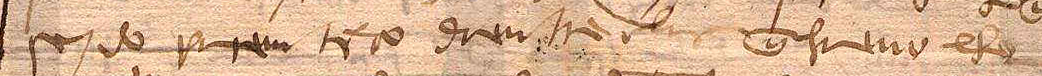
sej do paremtesco da entre elas q̄ ha molher
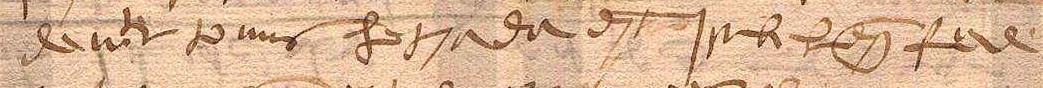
de mter tomas he tja da djta Jsabel dj̄z fa de
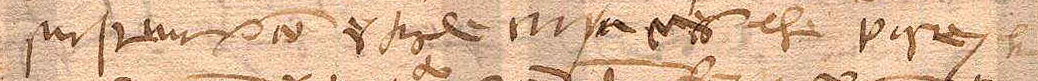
sua Jrma e cō estas decraraçoes lhe pasej ha
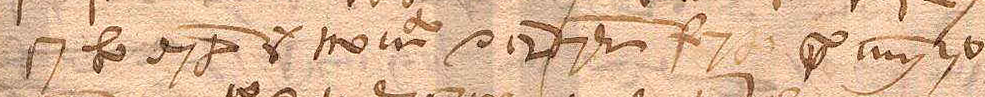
sj ho djto estromto e certjdā fejto p̄o mj̄ yo
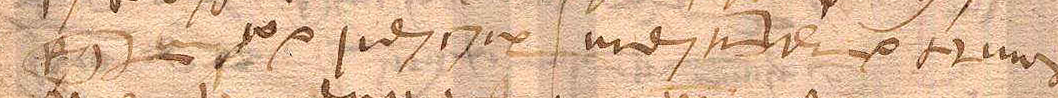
pj̄z tam ꝓco e Judjcjal na djta vila e termos
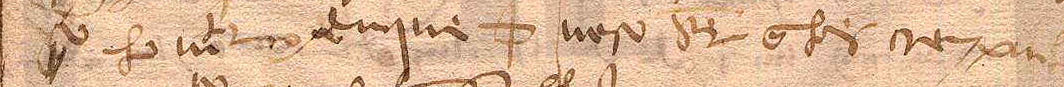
p̄o ho mter e duque noso sor q̄ ho escreuj e nele
